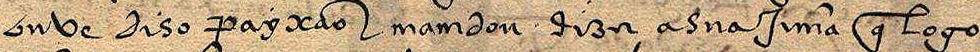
ouve diso payxaõ mamdou dizer a sua Jrmā q̄ logo
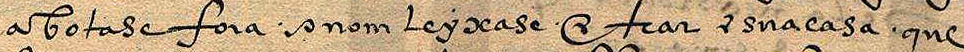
a botase fora. e nom Leyxase ētrar ē sua casa .que
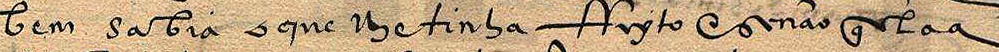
bem sabia o que lhe tinha ffeyto e se não q̄ elaa
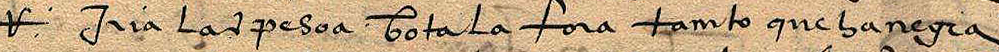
R Jria La ē pesoa bota La fora tamto que ha negra
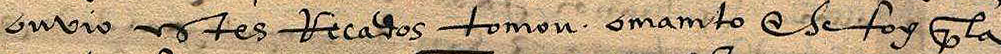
ouvio estes Recados tomou. o mamto e se foy p̄la
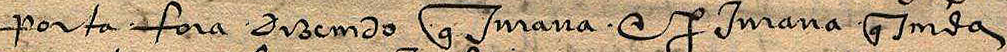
porta fora dizemdo q̄ Juraua. e ꝑJuraua q̄ Jmda
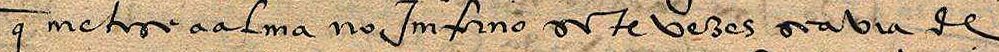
q̄ metese a aLma no Jmferno sete vezes se avia de
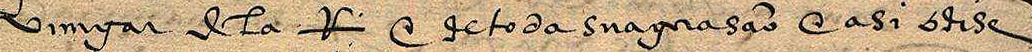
vimgar dela R e de toda sua gerasão e asi o dise
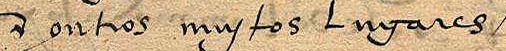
ē outros mujtos Lugares /
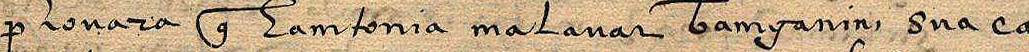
prouara q̄ hamtonia maLauar bamganim sua ca
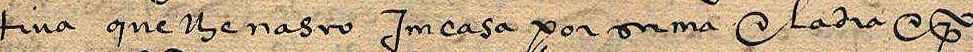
tiua que lhe nasceo Jm casa por ser ma e Ladra e p̄o
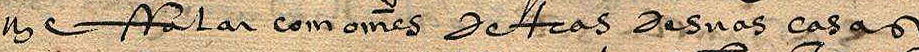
lhe ffalar com omes detras de suas casas
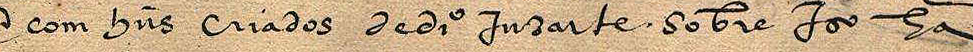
e com hūs criados de dio Juzarte Sobre Jso ha
